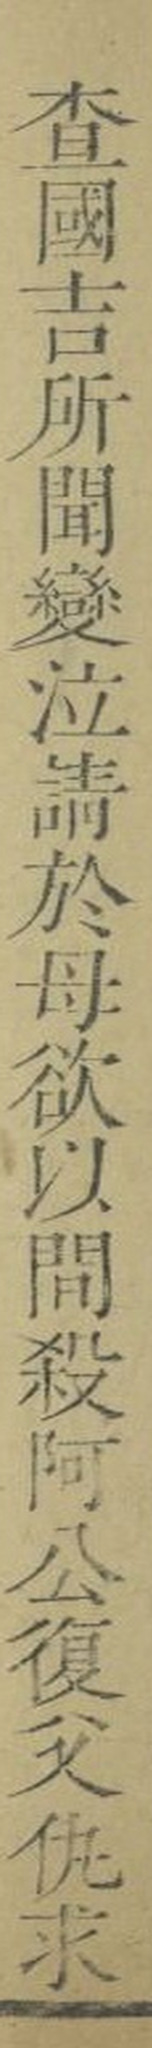査國吉所聞變泣請於母欲以間殺阿公復父仇求
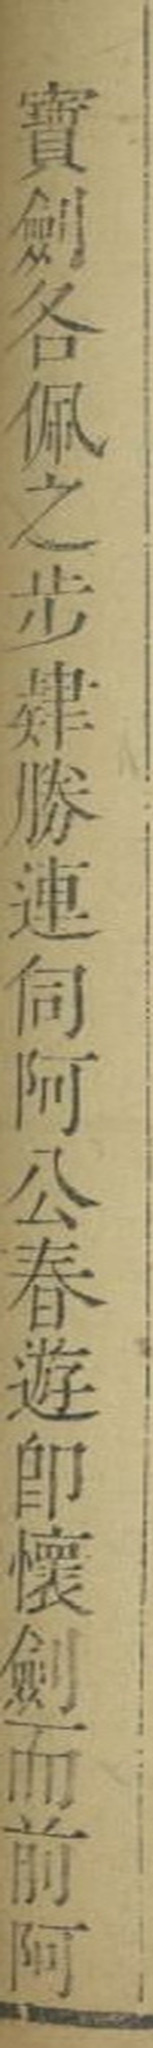寶劍各佩之步肄勝連伺阿公春遊卽懷劍而前阿
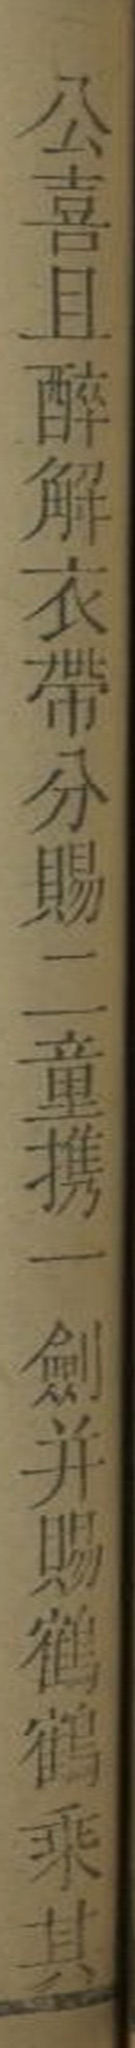公喜且醉解衣帶分賜二童携一劍并賜鶴鶴乘其
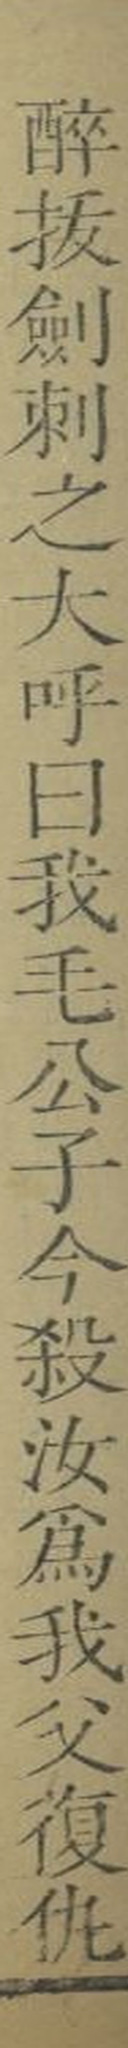醉㧞劍刺之大呼曰我毛公子今殺汝爲我父復仇
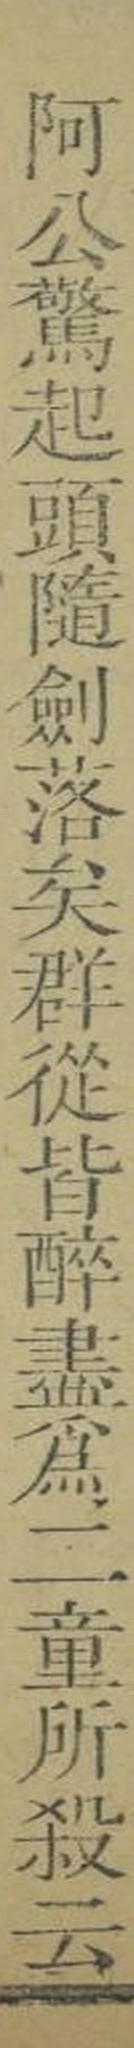阿公驚起頭隨劍落矣群從皆醉盡爲二童所殺云
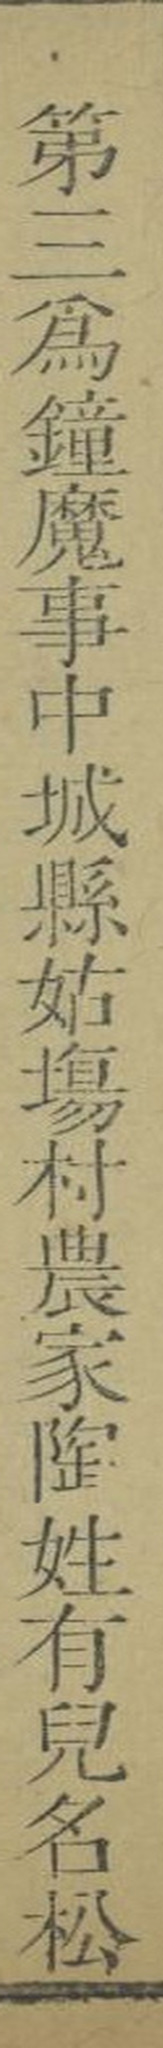第三爲鐘魔事中城縣姑塲村農家陶姓有兒名松
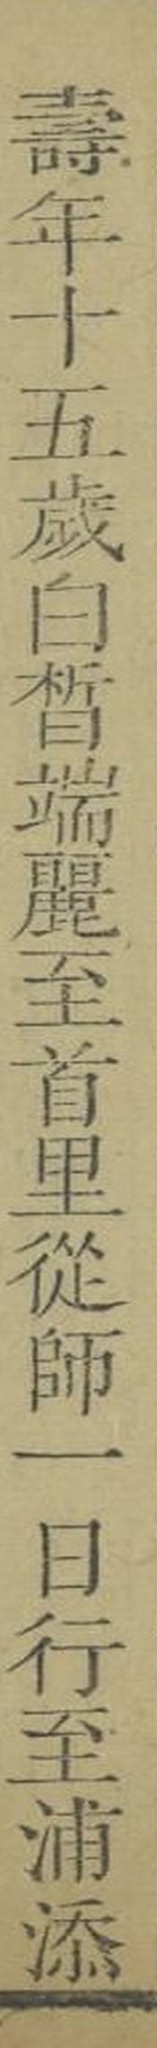壽年十五歲白晳端麗至首里從師一日行至浦添
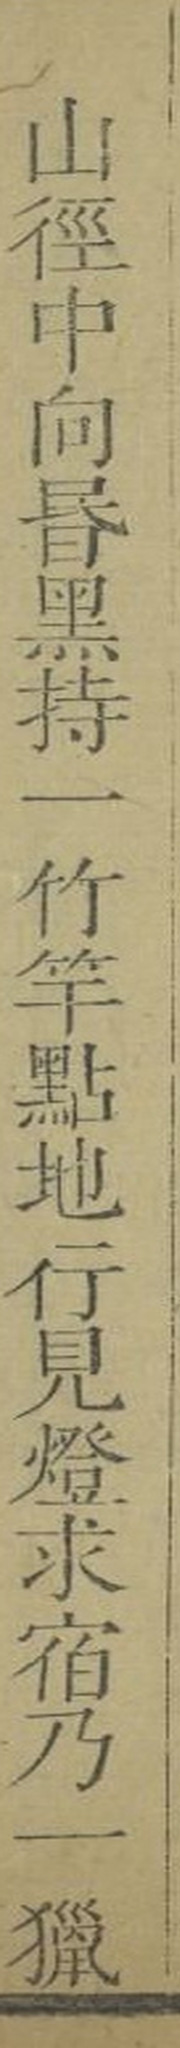山徑中向昬黑持一竹竿點地行見燈求宿乃一獵
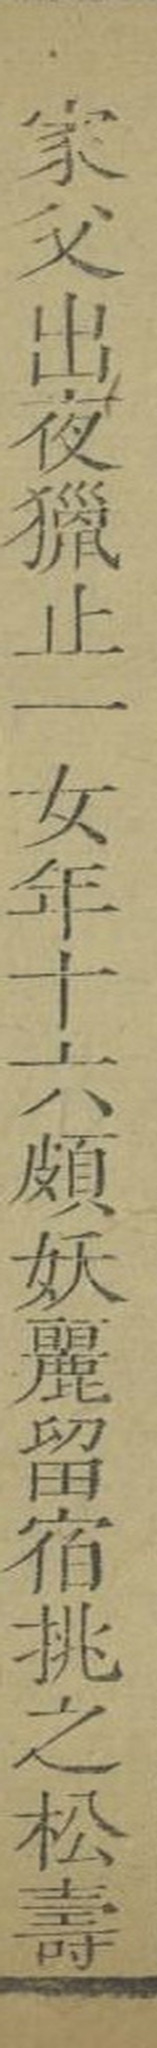家父出夜獵止一女年十六頗妖麗留宿挑之松壽
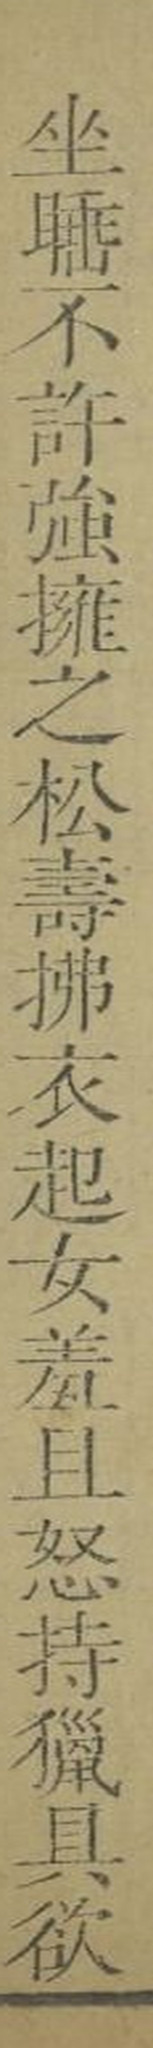坐睡不許強擁之松壽拂衣起女羞且怒持獵具欲
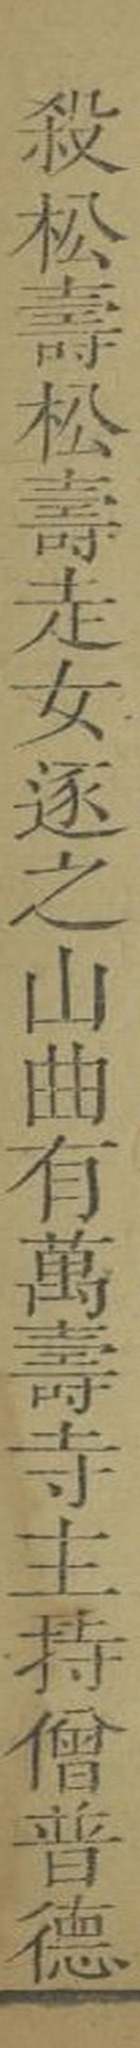殺松壽松壽走女逐之山曲有萬壽寺主持僧普德

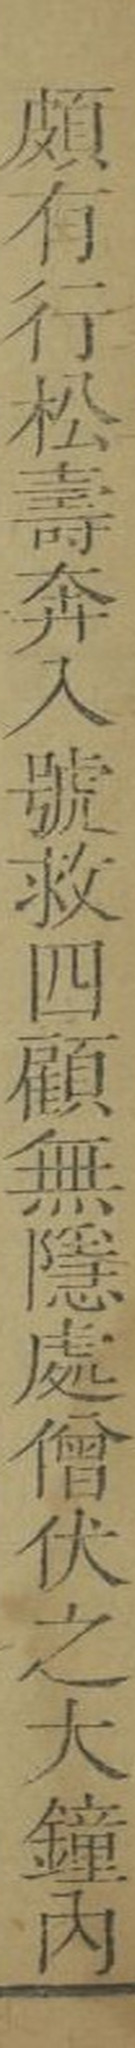頗有行松壽奔入號救四顧無隱處僧伏之大鐘内
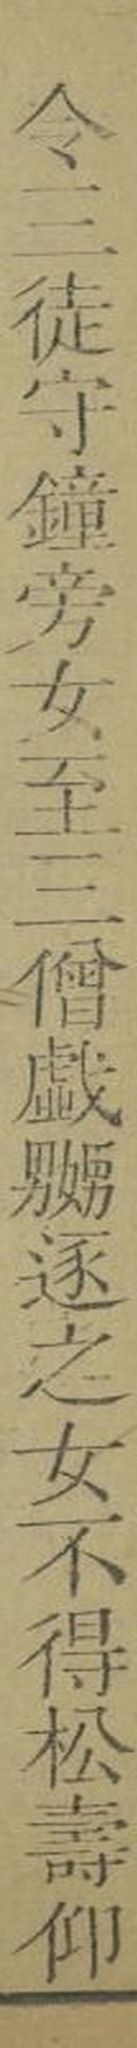令三徒守鐘旁女至三僧戱嬲逐之女不得松壽仰
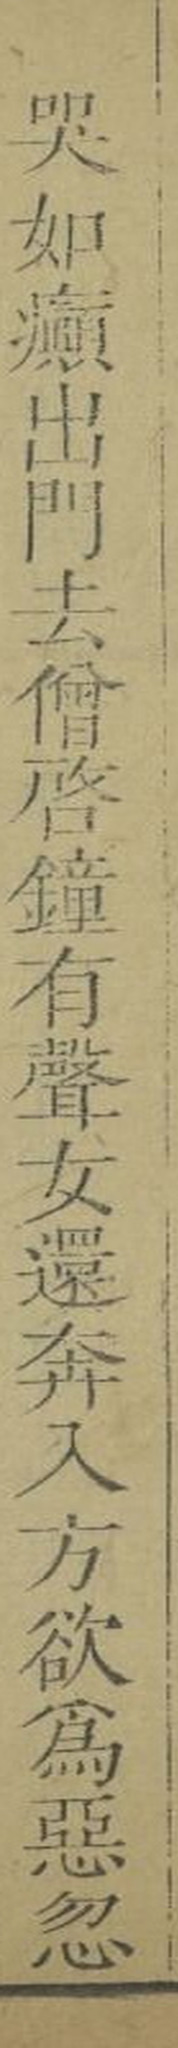哭如癲出門去僧啓鐘有聲女還奔入方欲爲惡忽
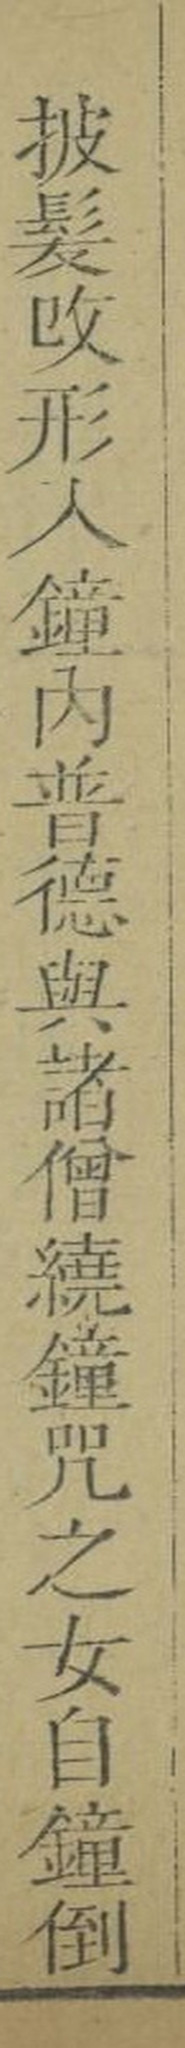披髪攺形入鐘内普德與諸僧繞鐘咒之女自鐘倒
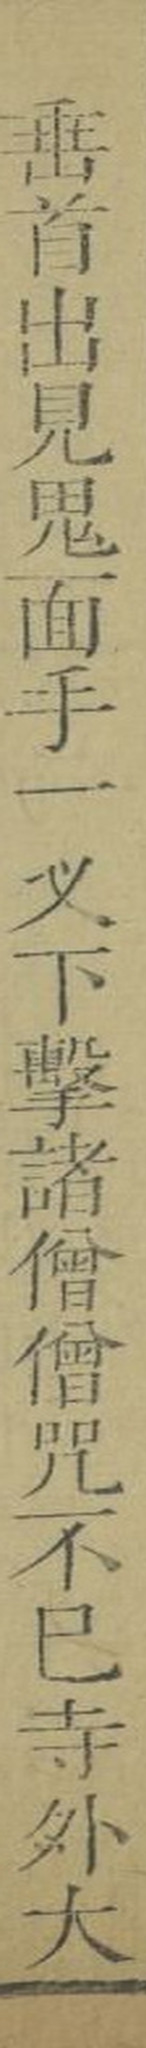垂首出見鬼面手一叉下擊諸僧僧咒不巳寺外大
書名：中山伝信録 巻二
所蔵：University of the Ryukyus Library
